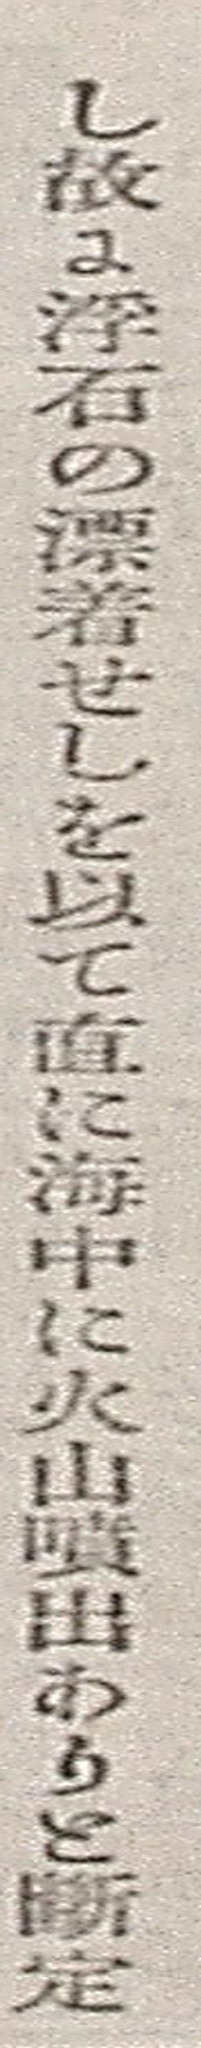し故に浮石の漂着せしを以て直に海中に火山噴出ありと断定
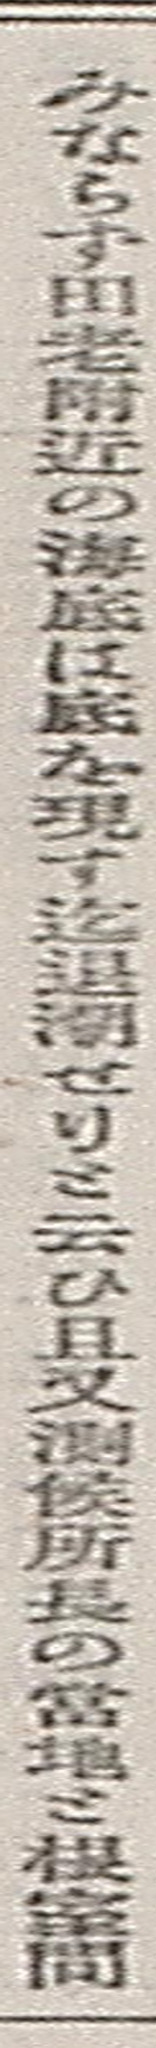みならず田老付近の海底は底を現す迄退潮せりと云ひ且又測候所長の当地と根室間
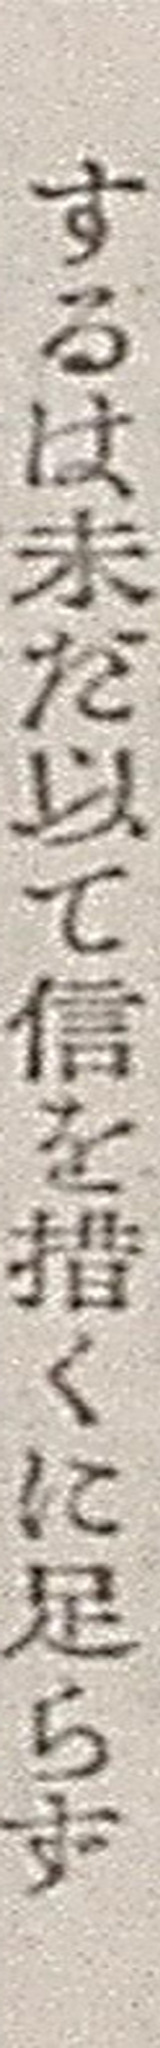するは未だ以て信を措くに足らず
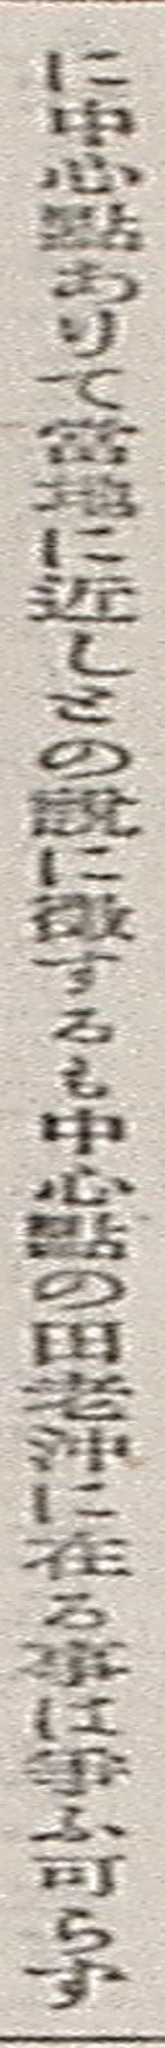に中心点ありて当地に近しとの説に徴するも中心点の田老沖に在る事は争ふ可らず
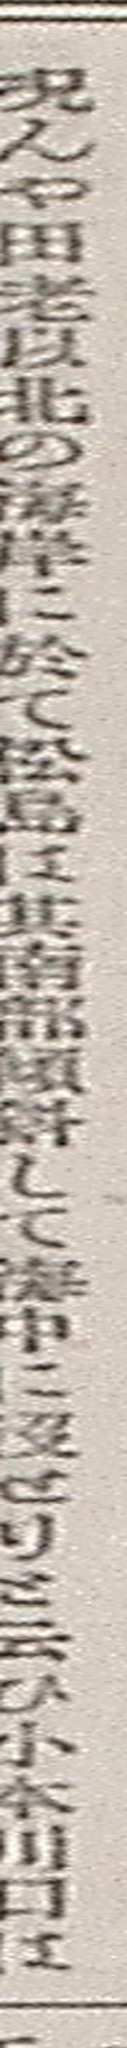况んや田老以北の海岸に於て松島は其南部傾斜して海中に没せりと云ひ小本川口は
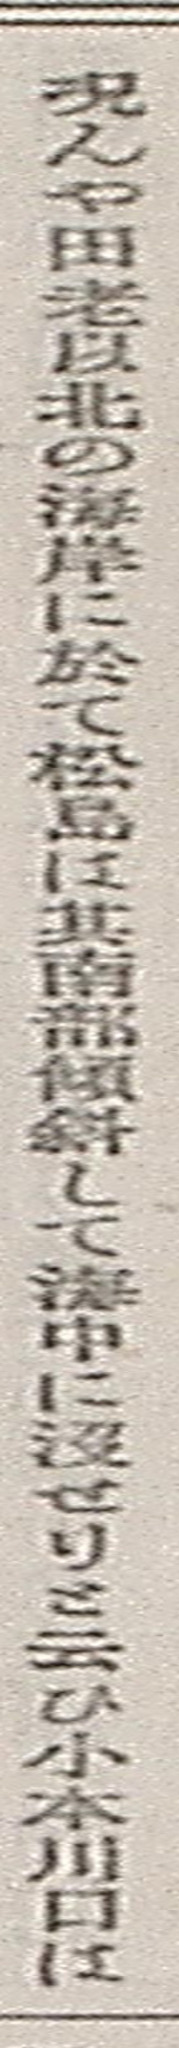况んや田老以北の海岸に於て松島は其南部傾斜して海中に没せりと云ひ小本川口は
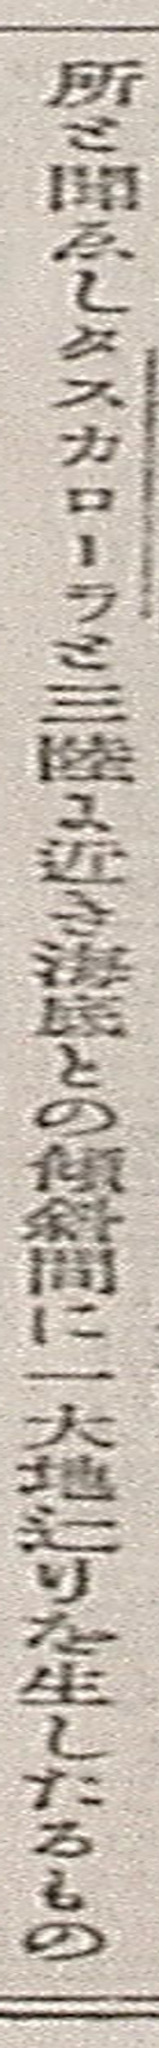所と聞ゑしタスカローラと三陸に近き海底との傾斜間に一大地辷りを生したるもの
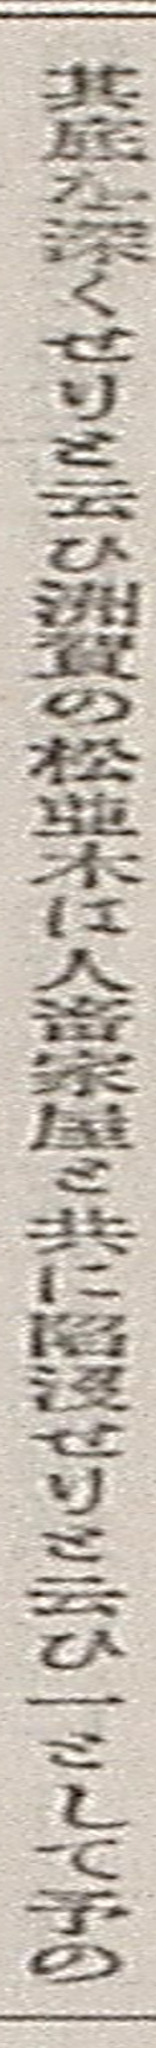其底を深くせりと云ひ洲賀の松並木は人畜家屋と共に陥没せりと云ひ一として予の
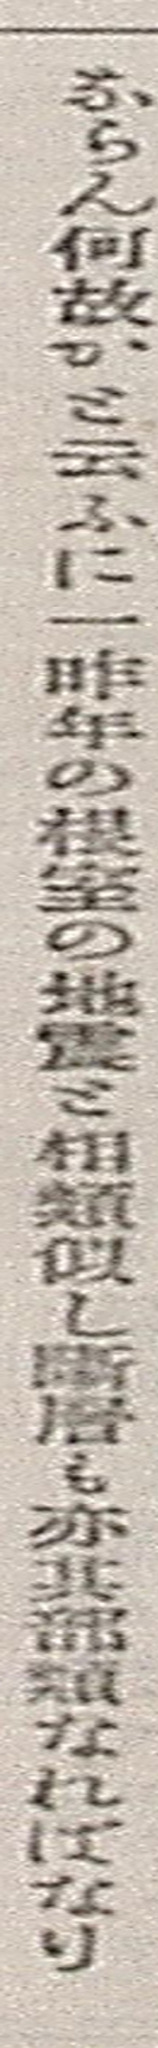ならん何故かと云ふに一昨年の根室の地震と相類似し断層も亦其部類なればなり
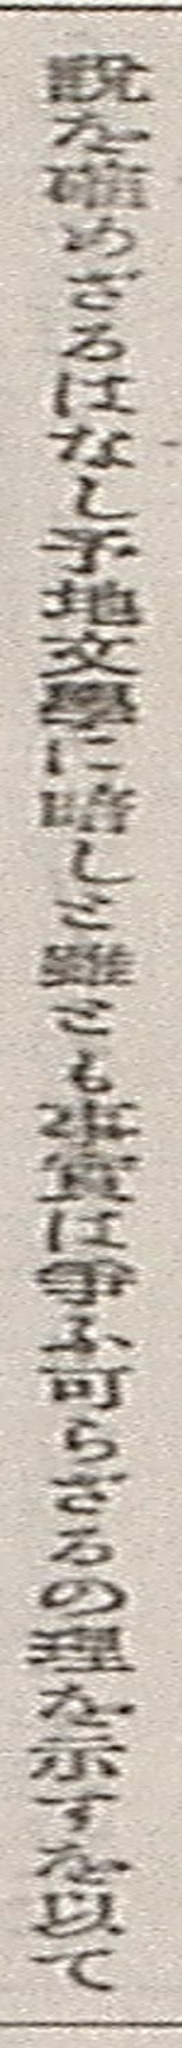説を確めざるはなし予地文学に暗しと雖とも事実は争ふ可らざるの理を示すを以て
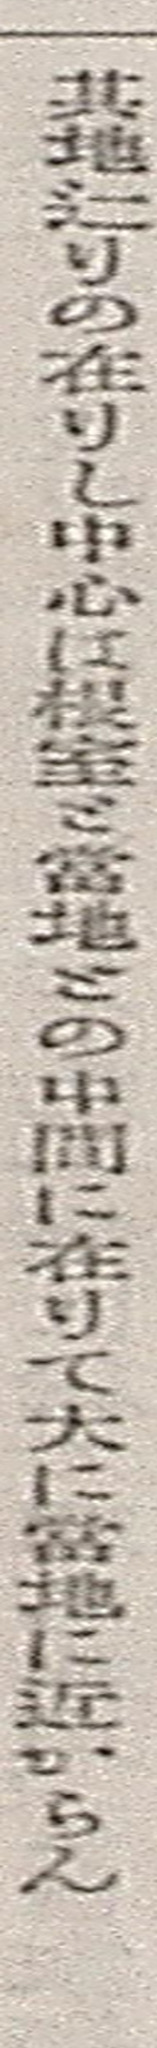其地辷りの在りし中心は根室と当地との中間に在りて大に当地に近からん
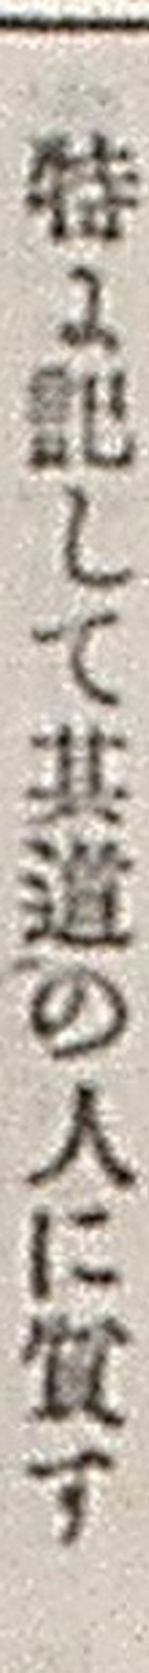特に記して其道の人に質す
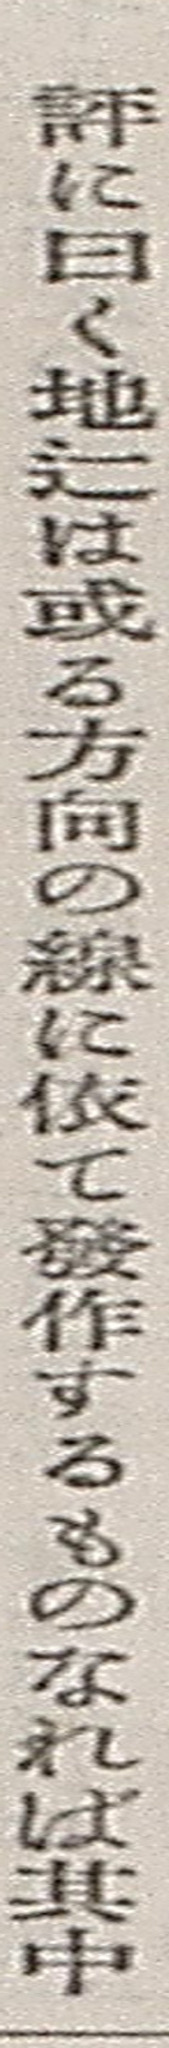評に曰く地辷は或る方向の線に依て発作するものなれば其中
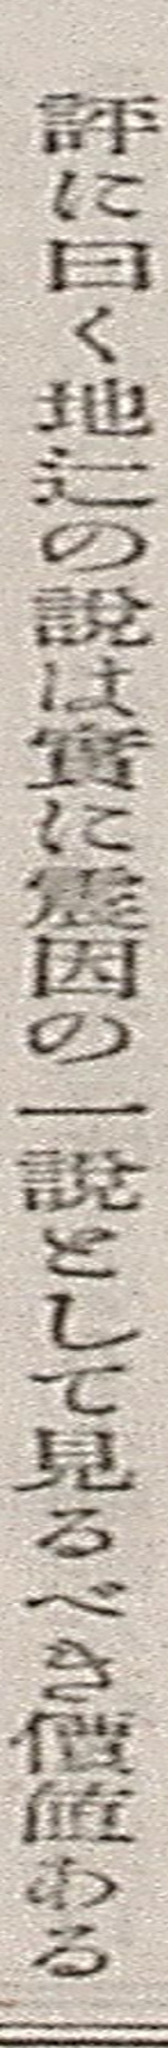評に曰く地辷の説は実に震因の一説として見るべき価値ある
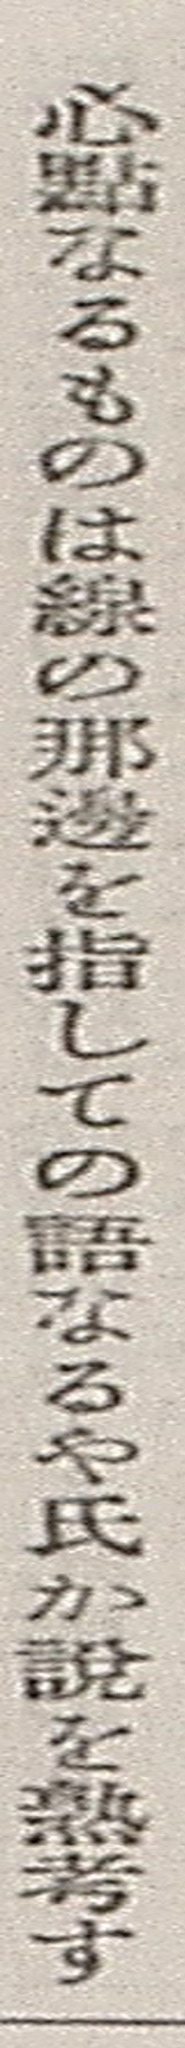心点なるものは線の那辺を指しての語なるや氏か説を熟考す
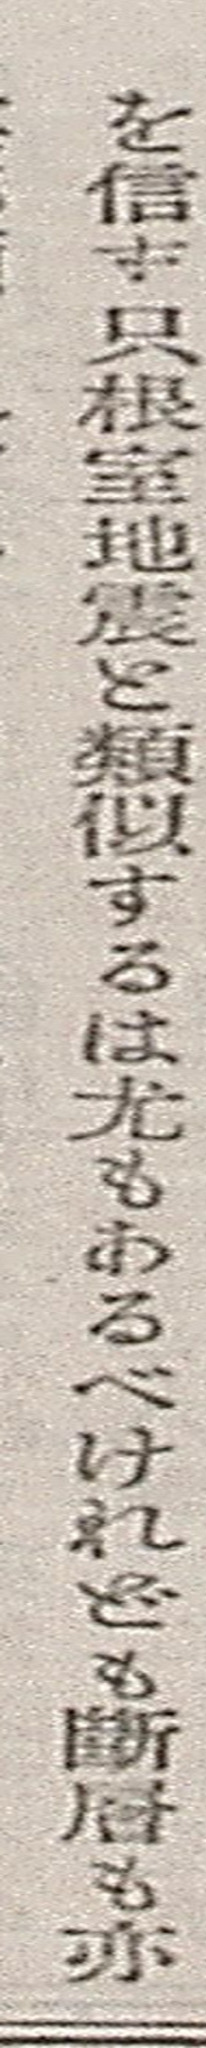を信ず只根室地震と類似するは尤もあるべけれども断層も亦
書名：風俗畫報臨時増刊第百十九號　大海嘯被害録（中）
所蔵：東京大学地震研究所図書室 Earthquake Research Institute Library, The University of Tokyo, JAPAN
